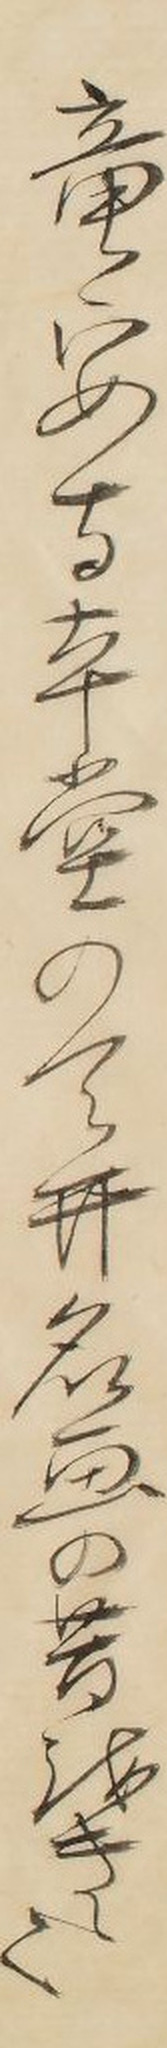竜安寺本堂の天井名画の昔をきゝて
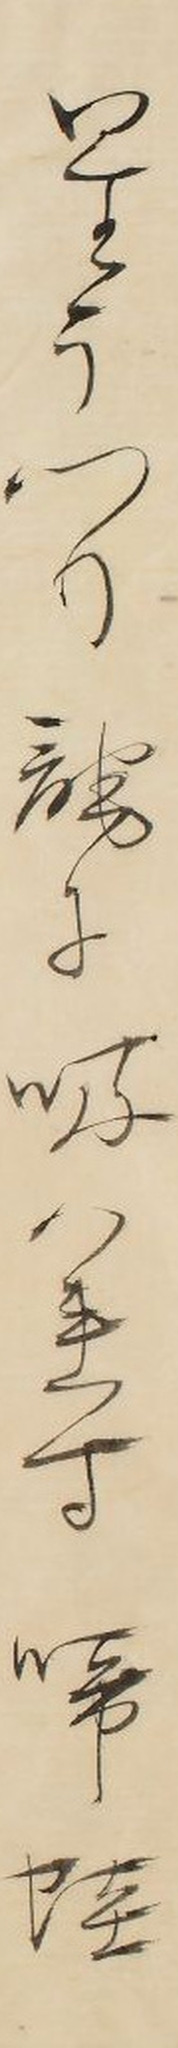星うつり龍に吸はれす啼蛙
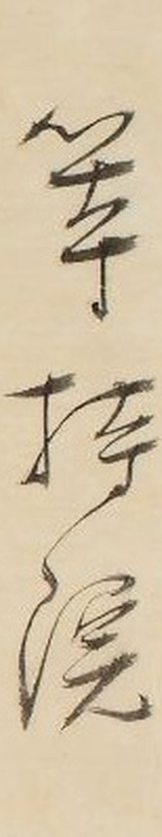等持院
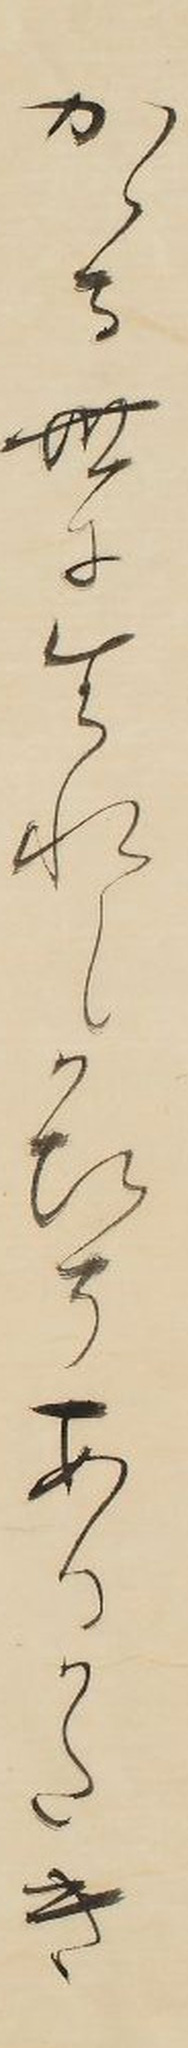かゝる世に生れしかひそありかたき
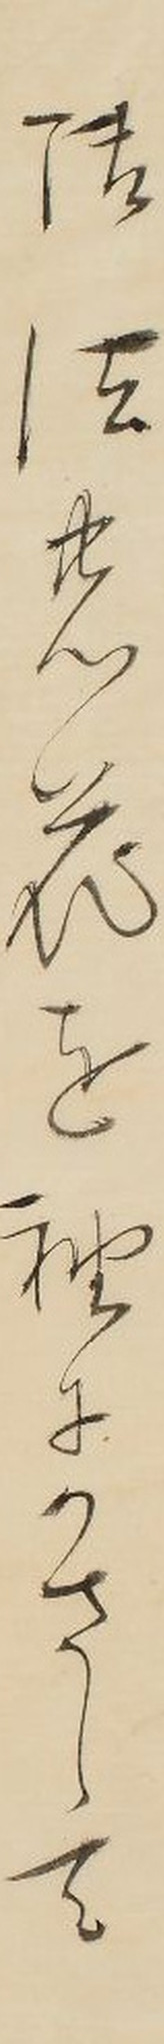御法の花を袖にかさして
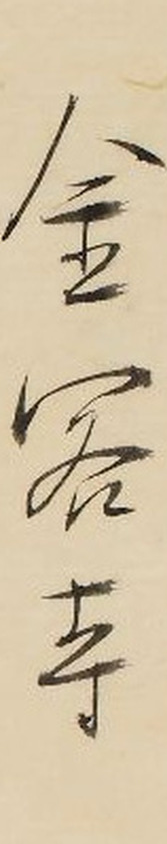金閣寺
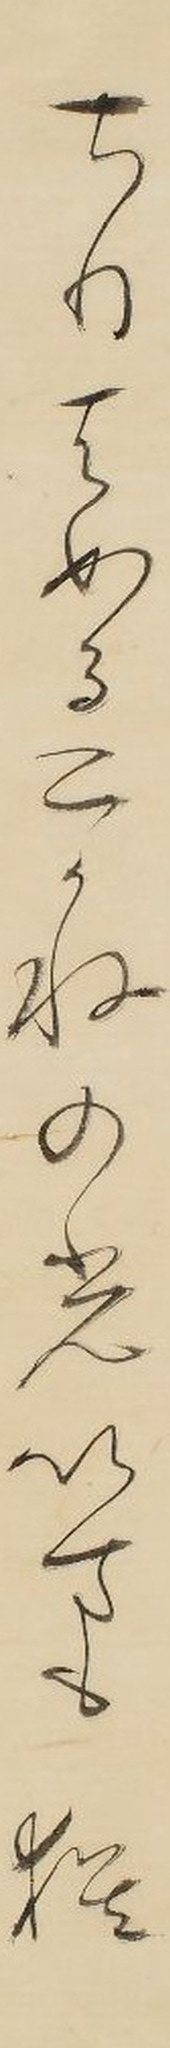ちりはめるこかねの光いまも猶
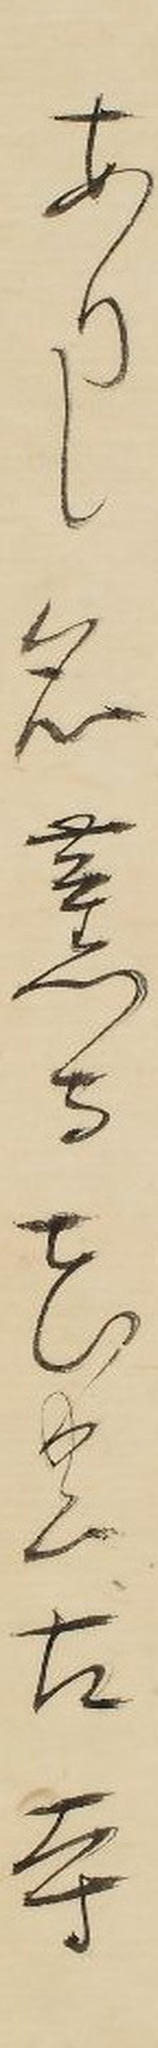ありし名薫る花の古寺
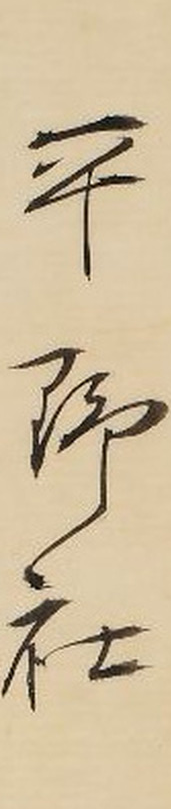平野社
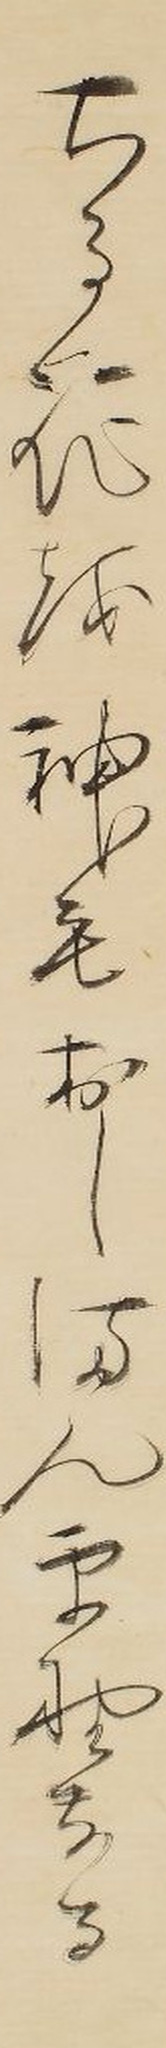ちる花を神もおしまん平野なる
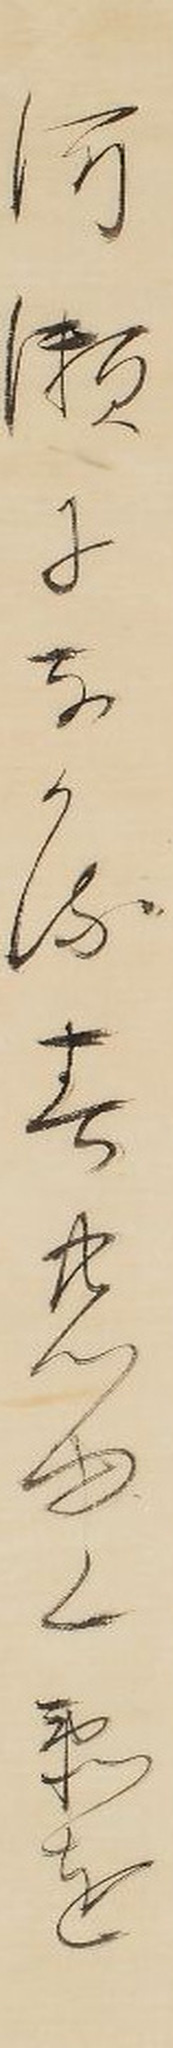河瀬になかる春のゆくゑを
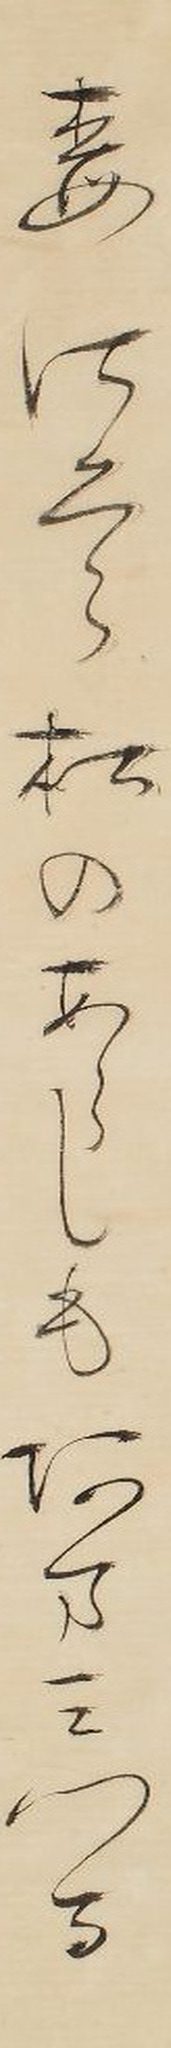梅さくら松のあらしもあまみつる
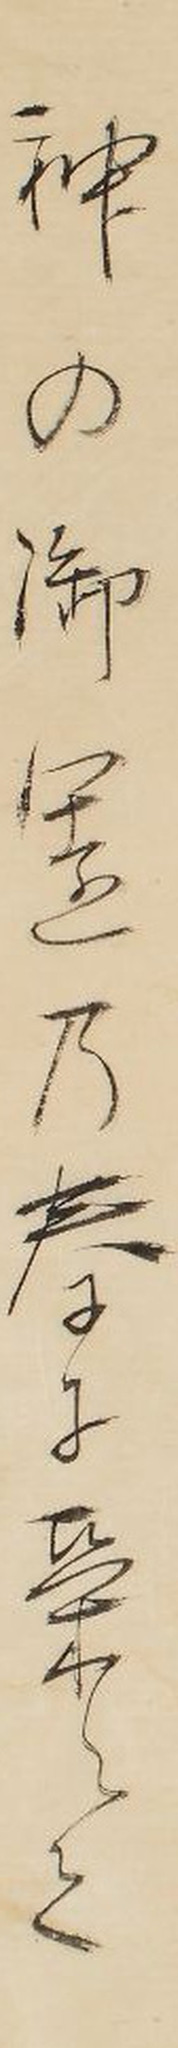神の御園の春に栄えて
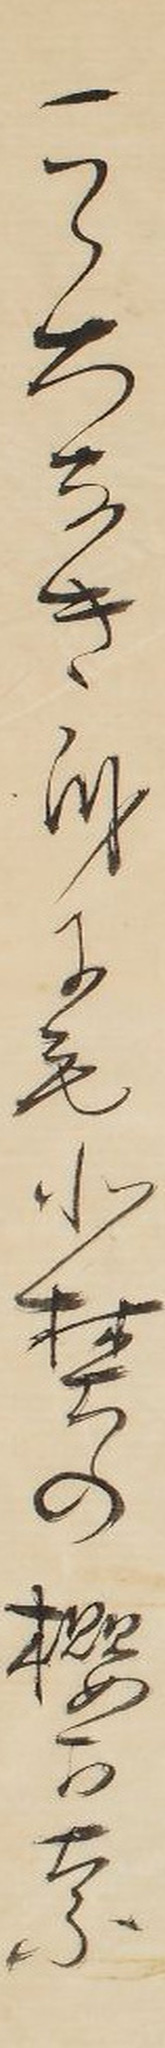こゝろなき身にも北野の桜かな
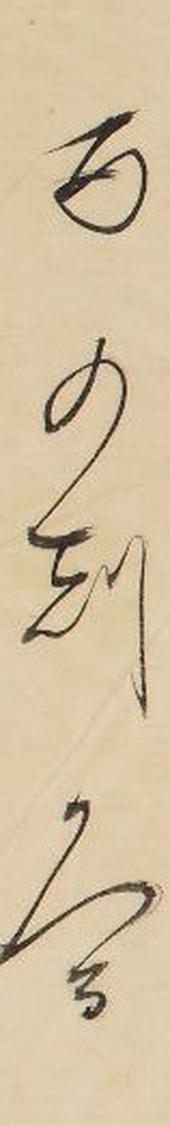酉の刻かへる
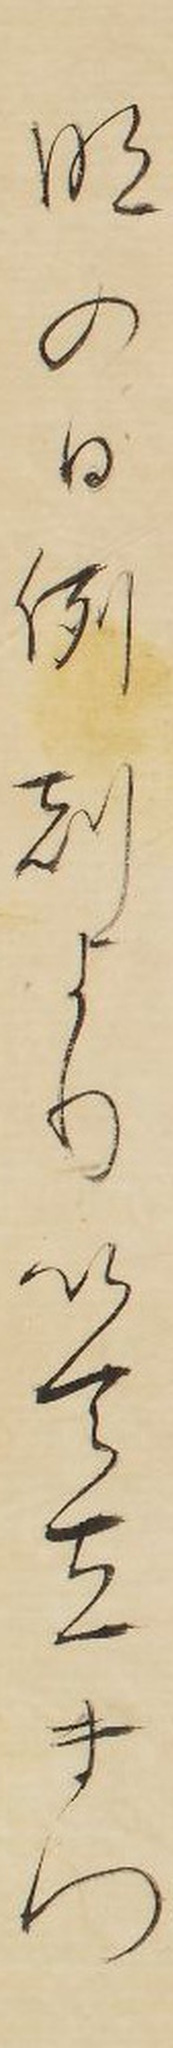明の日例刻よりいて立まつ
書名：花土産
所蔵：徳島県立図書館
